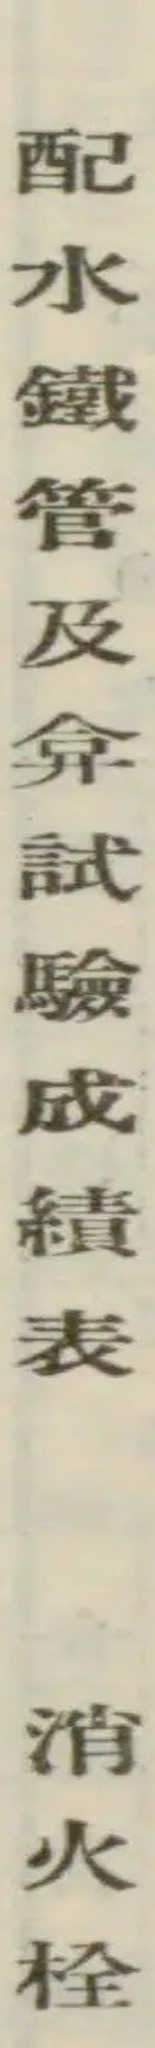配水鐵管及弇試験成績表消火栓
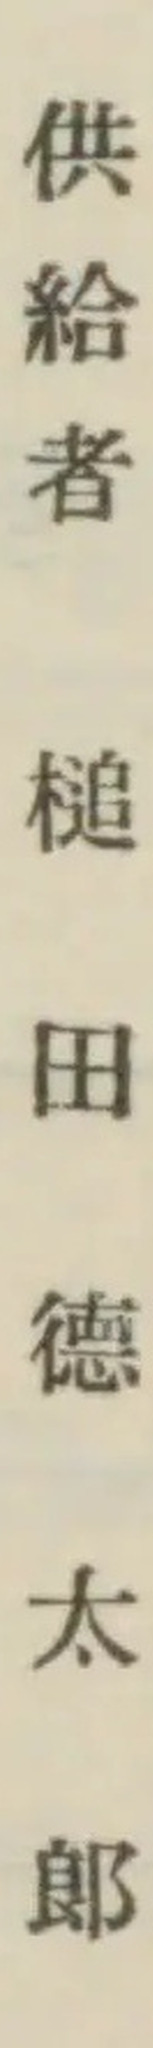供給者槌田徳太郎
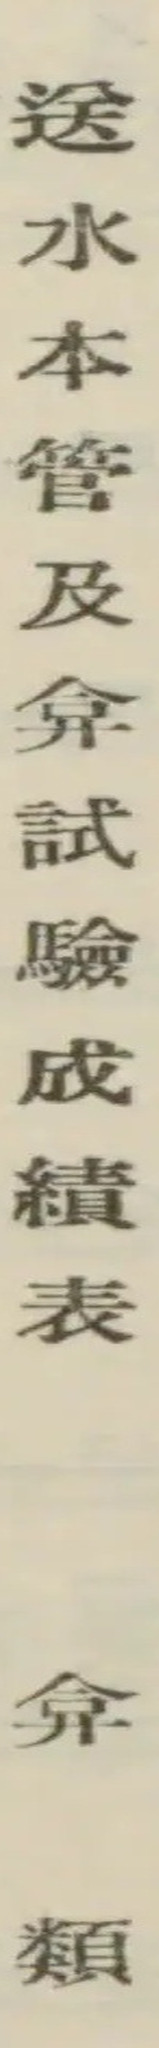送水本管及弇試験成績表弇類
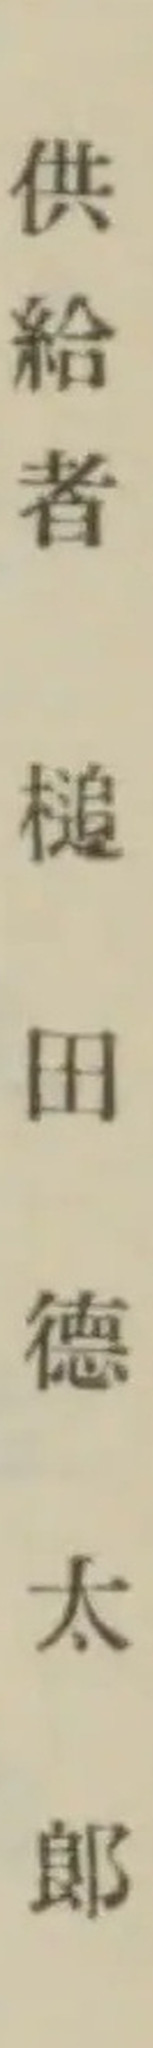供給者槌田徳太郎
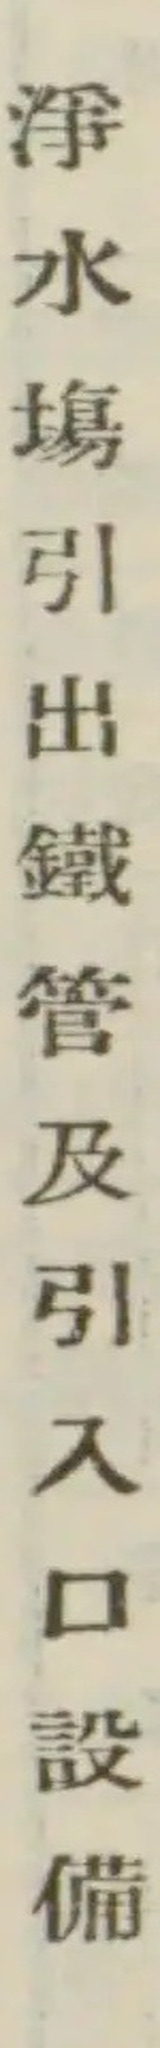浄水場引出鐵管及引入口設備
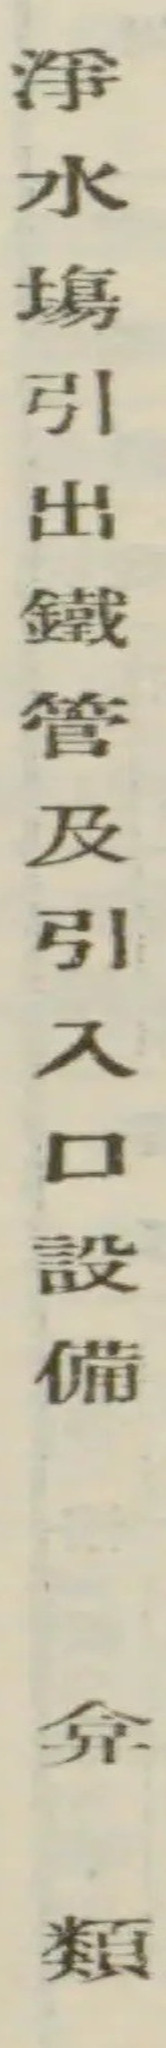浄水場引出鐵管及引入口設備
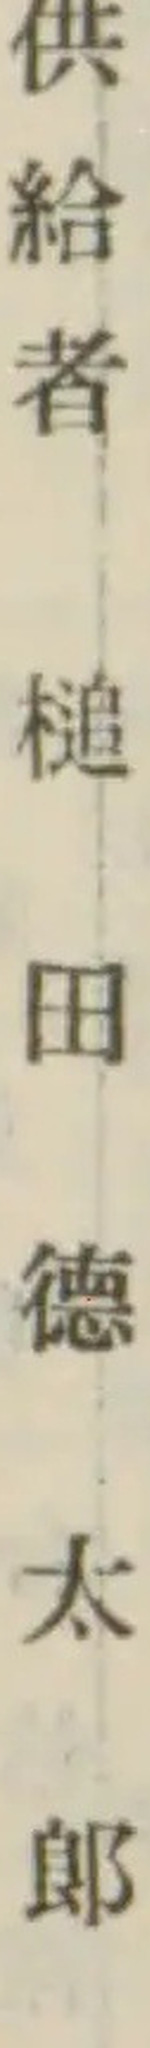供給者槌田徳太郎

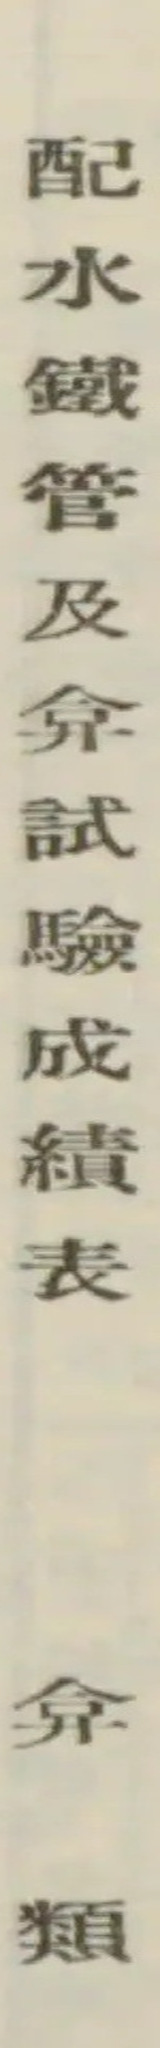配水鐵管及弇試験成績表弇類
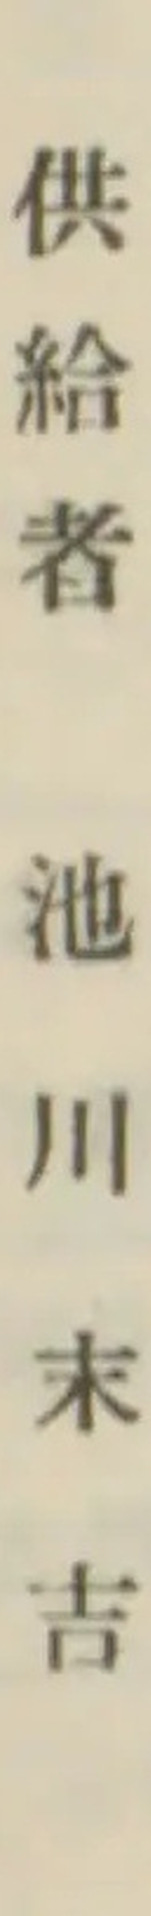供給者池川末吉
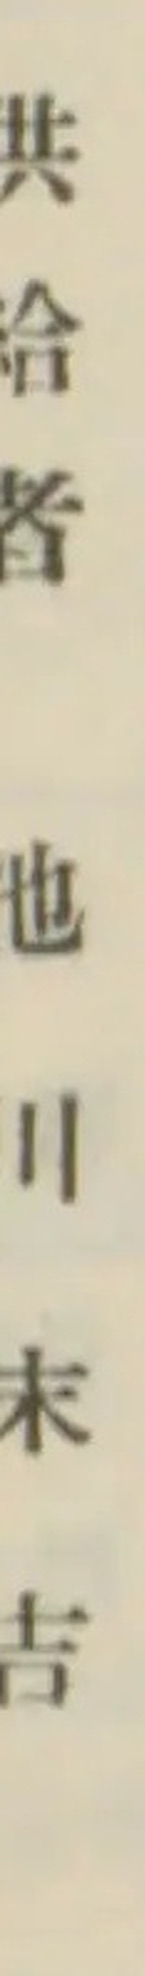供給者池川末吉

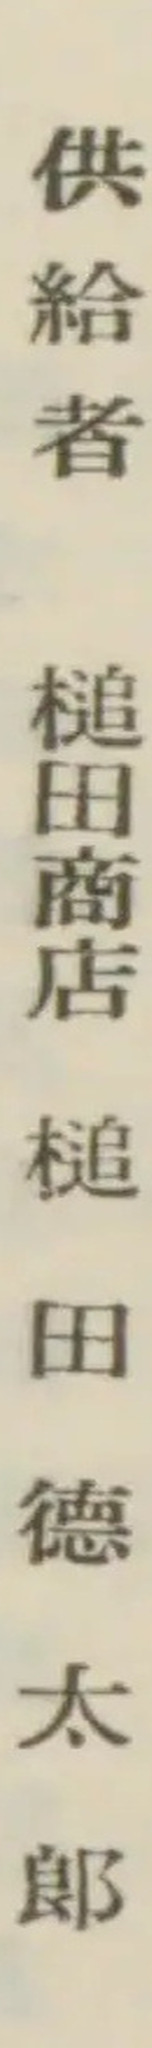供給者槌田商店槌田德太郎
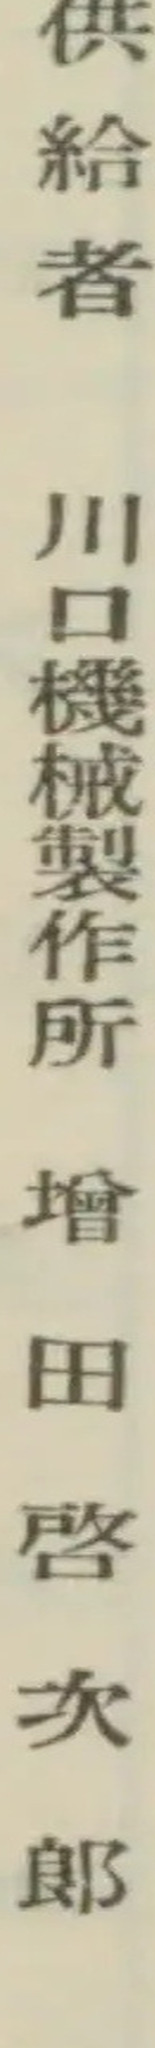供給者川口機械製作所増田啓次郎
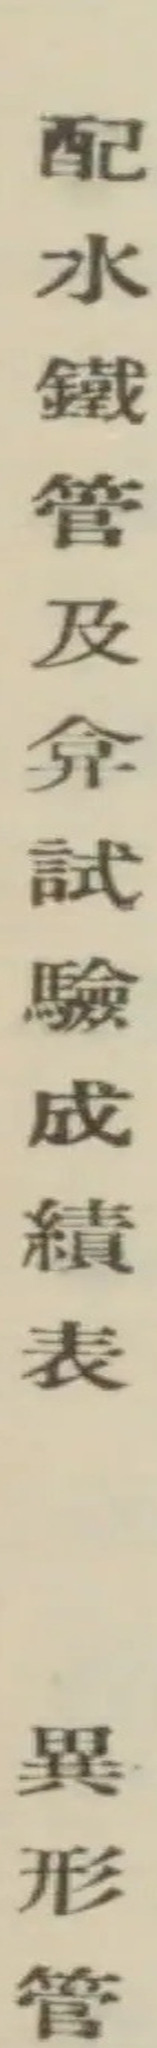配水鐵管及弇試験成績表異形管

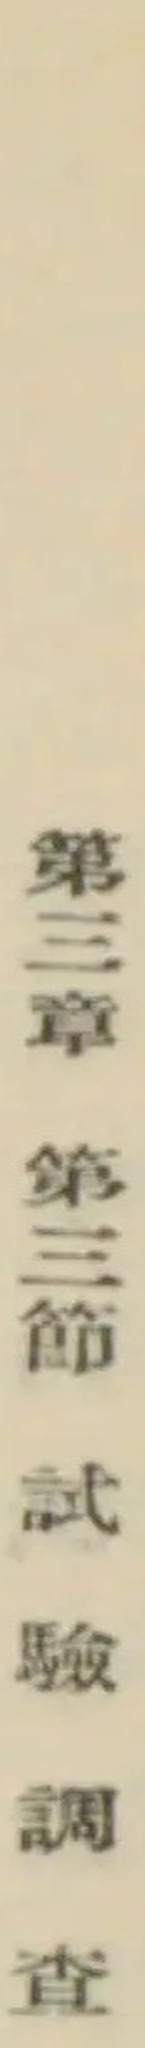第三章第三節試験調査
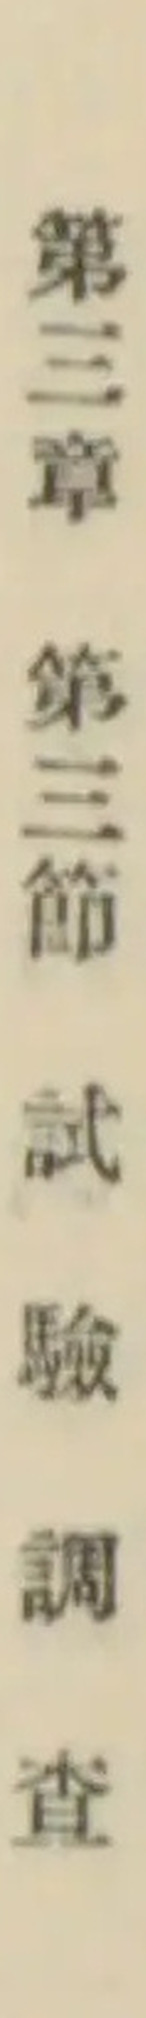第三章第三節試験調査
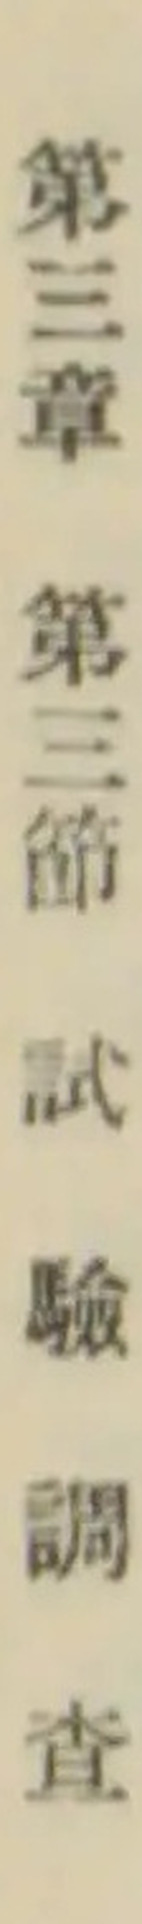第三章第三節試験調査
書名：豊橋市水道誌
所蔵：国立国会図書館 National Diet Library, JAPAN
